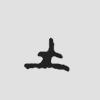土
